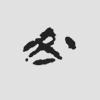{文一}
